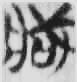戕
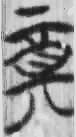奠
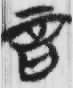言
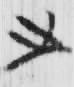之
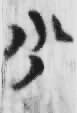少
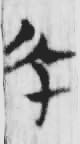帀（師）
